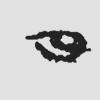日
